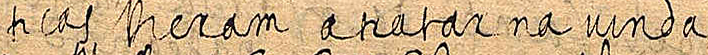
ticas vieram a tratar na uinda
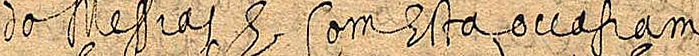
do Messias E Com Esta occasiam
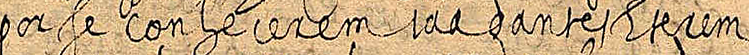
por se conhecerem iaa dantes E terem
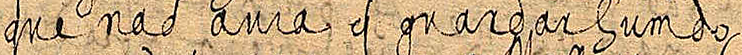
que naõ auia q̄ guardar hum do
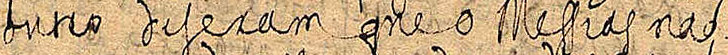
outro diseram que o Messias naõ
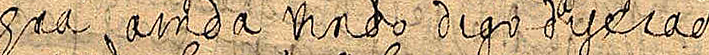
Era ainda vindo digo diseraõ
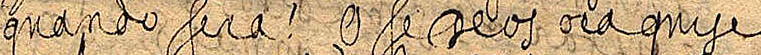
quendo sera? O se Deos ora quise
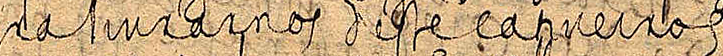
ra liurarnos deste catiueiro E
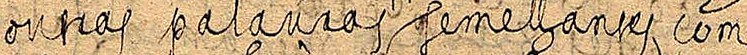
outras palauras semelhantes com
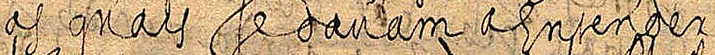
as quais se dauam a Entender
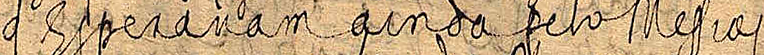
q̄ Esperauam ainda pelo Messias
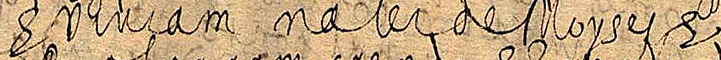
E viuiam na lei de Moyses, E
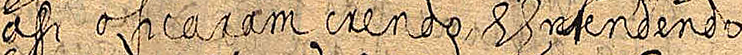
assi o ficaram crendo, E Entendendo
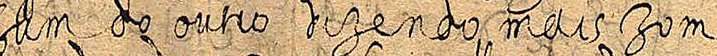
hum do outro dizendo mais zom
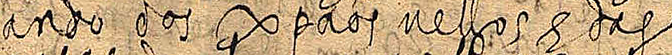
bando dos xpaõs uelhos E das
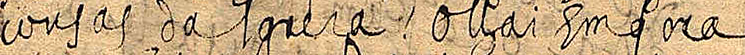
cousas da Igreia! Olhai Em q̄ ora
